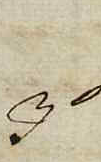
3o
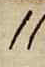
11
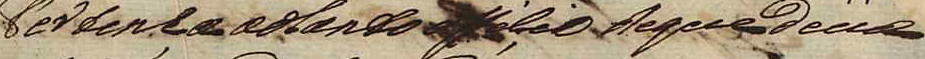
Pertença o santo offiçio de que deua
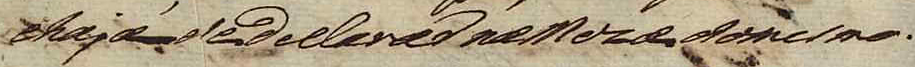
e haja de declarar na Meza do mesmo.
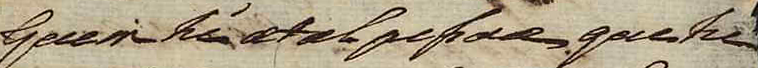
Quem hé a tal pessoa que he
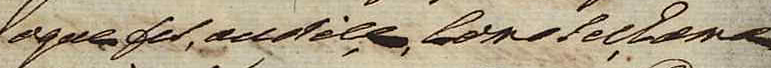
o que fes, ou diçe, como se çhama
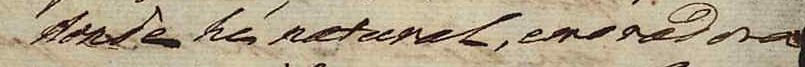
donde hé naturaL, e moradora
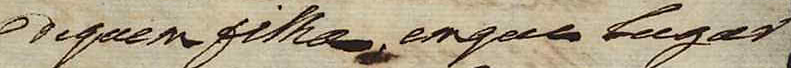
de quem filho, em que Lugar
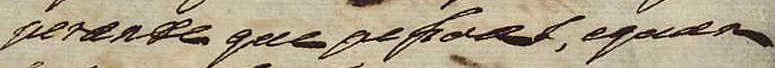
perante que pessoas, e quan
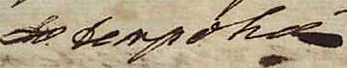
to tempo há
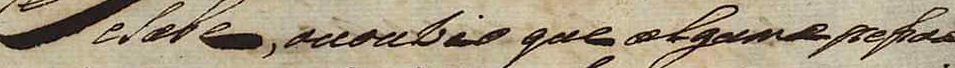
Se sabe, ou ouvio que aLguma pessoa
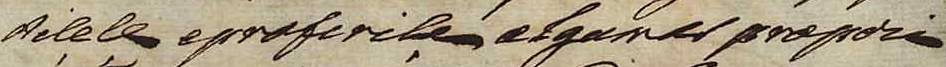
diçece e proferiçe algumas propozi
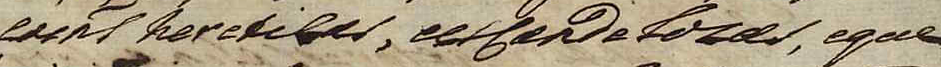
çoeñs hereticas, e esCandalozas, e que
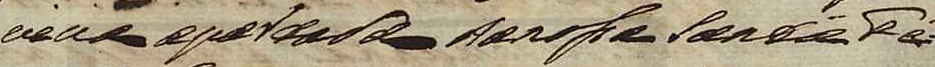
viua apartado de nossa santa Fé
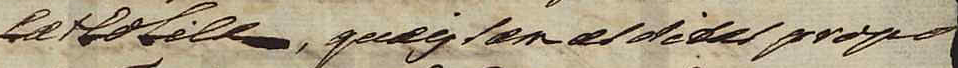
Catholica, quais sam as ditas propo
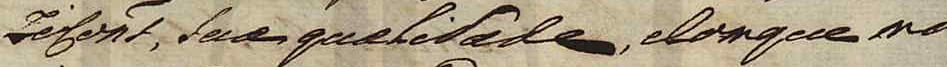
ziCoñs, sua qualidade, e com que mo
